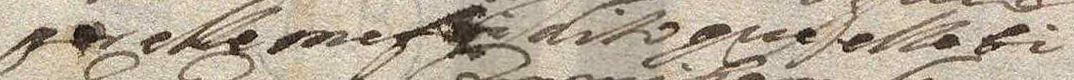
por elle me foi dito que elle ti
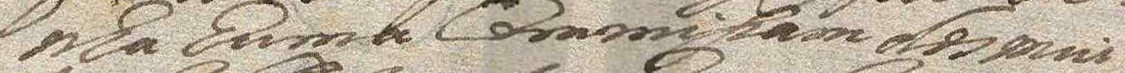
nha huma Commissam dos mui
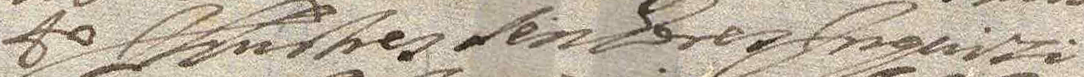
to Jllustres senhores Jnquizi
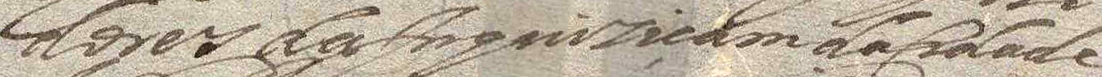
dores da Jnquiziçam da Cidade
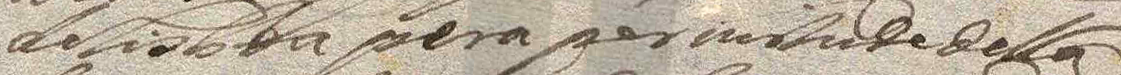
de Lisboa pera por virtude della
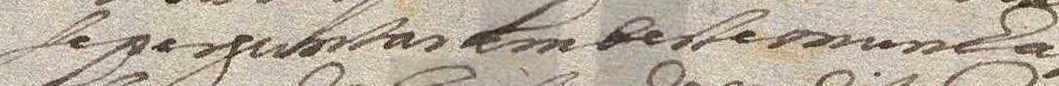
se perguntarem testemunhas
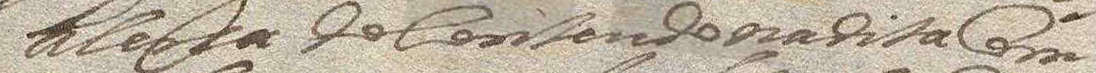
acerca do Conteudo na dita Com
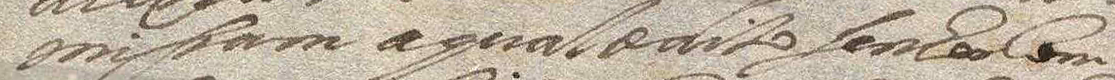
missam a qual o dito senhor Com
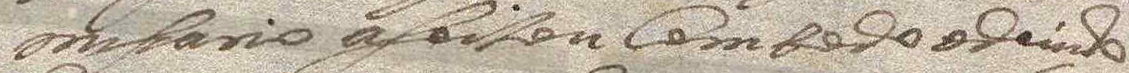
missario aseitou Com todo o devido
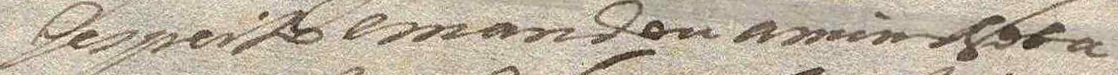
Respeito e mandou a mim Nota
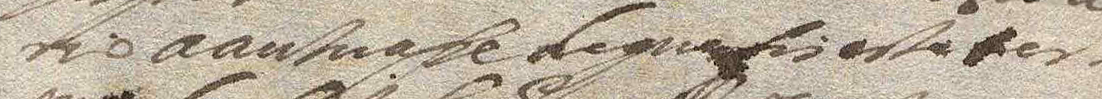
rio o autuasse de que fis este ter
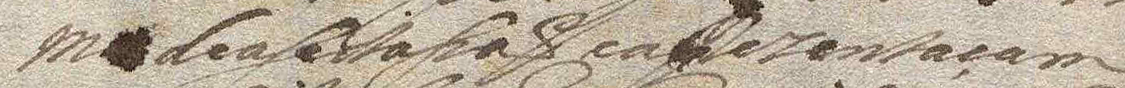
mo de aseitassaõ e apRezentaçam
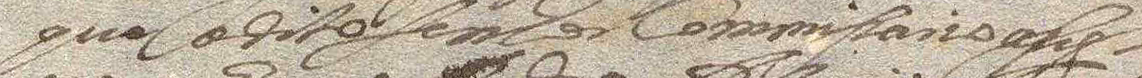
que o dito senhor Commissario assig
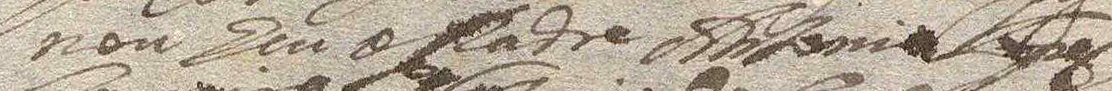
nou e eu o Padre Antonio Lopes
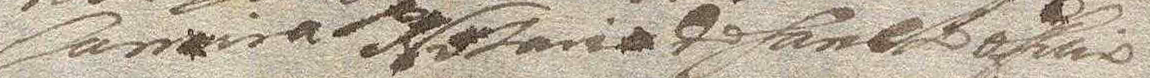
Carreira Notario do sancto officio
